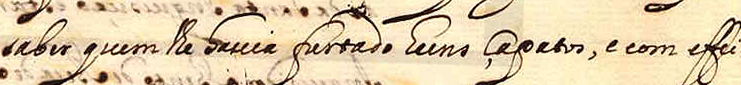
saber quem lhe havia furtado huns çapatos, e com effei
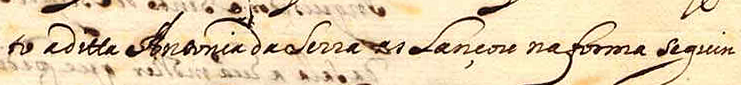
to a ditta Antonia da Serra as lançou na forma seguin
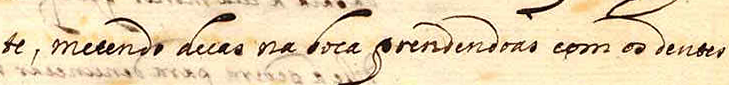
te, metendo duas na boca prendendoas com os dentes
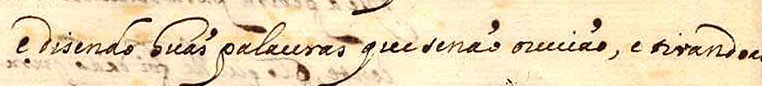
e disendo huās palavras que se naõ ouuião, e tirandoas
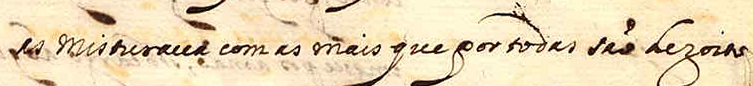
as misturaua com as mais que por todas são dezoito
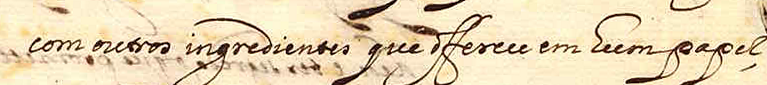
com outros ingredientes que offerece em hum papel,
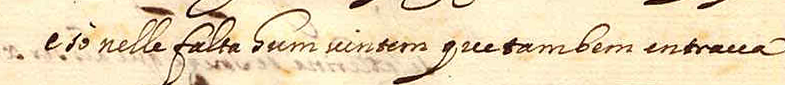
e sò nelle falta hum vintem que também entraua
